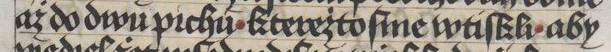aż do dwu pichú.ktereżto ſme wtiſkli.aby
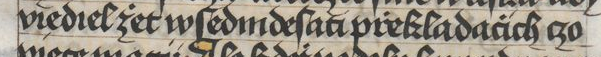viedel żet w ſedmdeſati pṙekladaċích zo¬
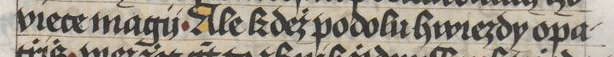víete magij.Ale kdež podolu hwiezdy opa¬
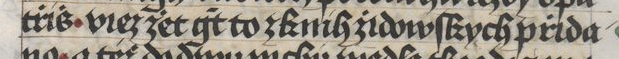tříṡ. viez żet ḡt to z knih żidowſkych pṙida¬
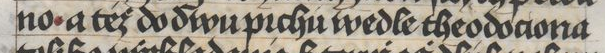no.a též do dwu pichú wedle theodocioria
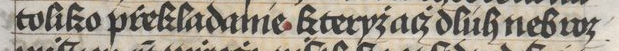toliko pṙekladaníe.kteryż acż dlúh neb roz¬
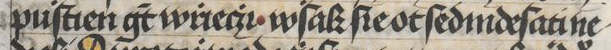puẛtien ḡt wṙiecżi.wẛak ſie ot ſedmdeſati ne¬
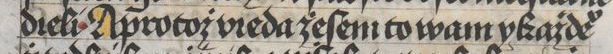dielí.Aprotoż vieda żeſem to wam y każdev
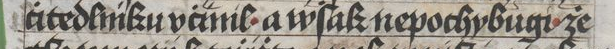ċitedlniku uċinil.a wẛak nepochybugi.że¬
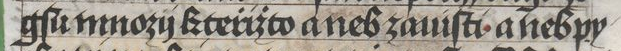gſu mnozij kteṙiżto a neb zauiſtí.a neb py¬
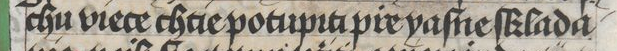chu viece chtíe potupiti pṙe yaſne ſklada¬
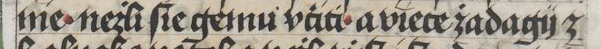nie.neżli ſie gemu uċiti.a viece żadagij z
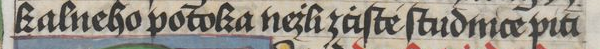kallneho potoka nežli zċiſté ſtudnice píti
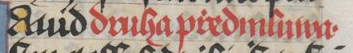Avid druha předumluwa.
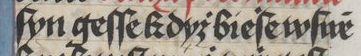ſyn geſſe když bieẛe wſwé
